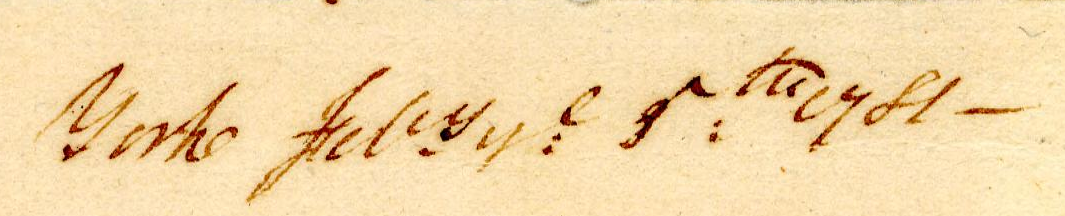York Feb^y: y^e 5^th 1781
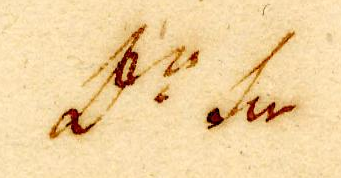D^r Sir
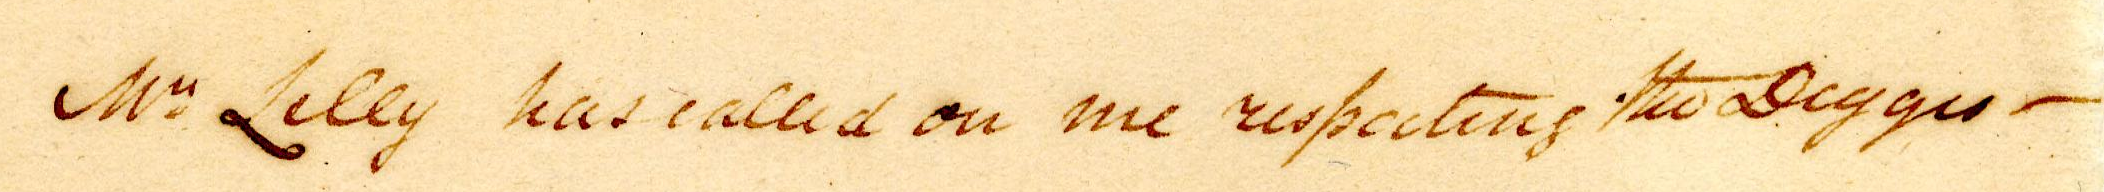M^rs. Lilly has called on me respecting the Degges-
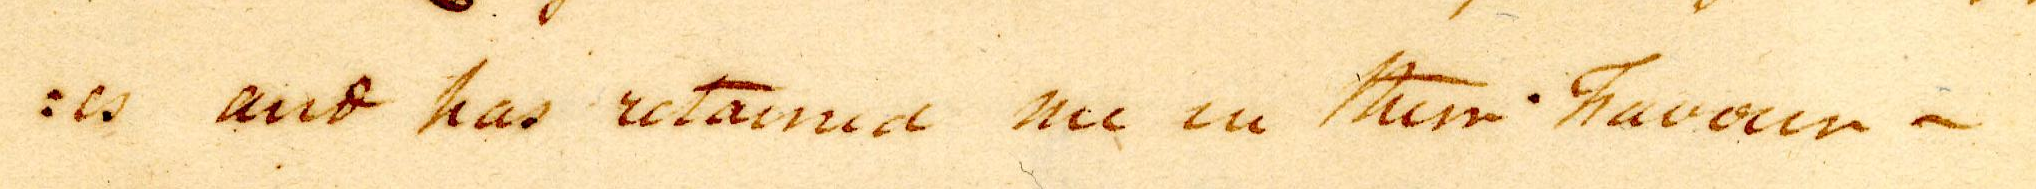-es and has retained me in their Favour.
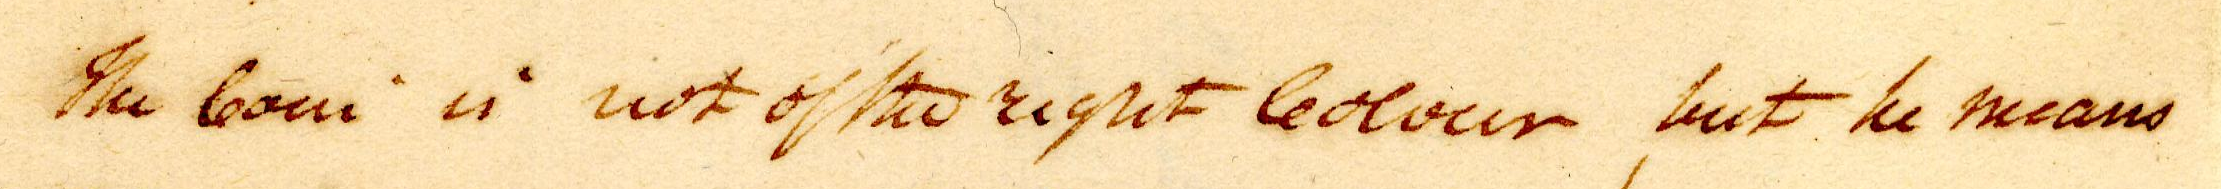The Court is not of the right Colour but he means
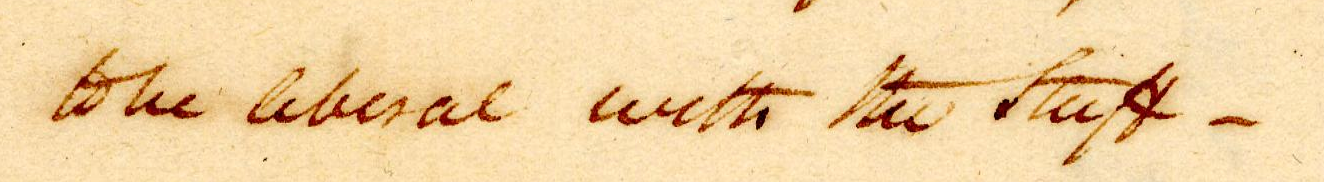to be liberal with the Stuff.
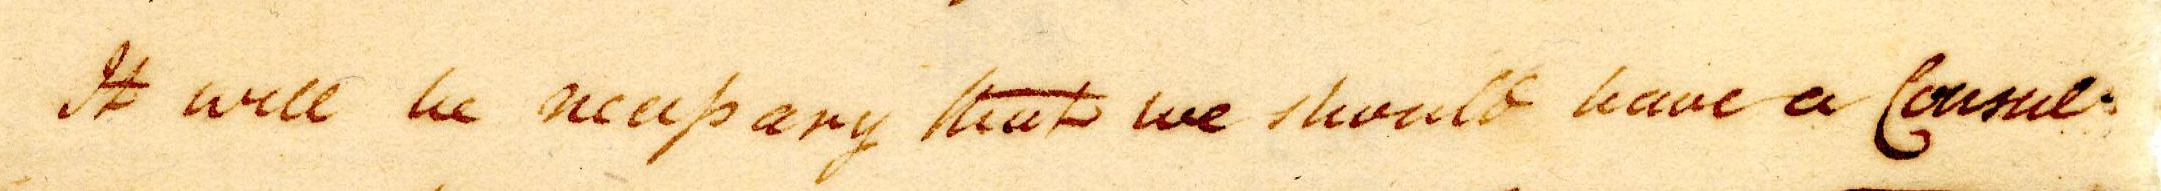It will be necessary that we should have a Consul-
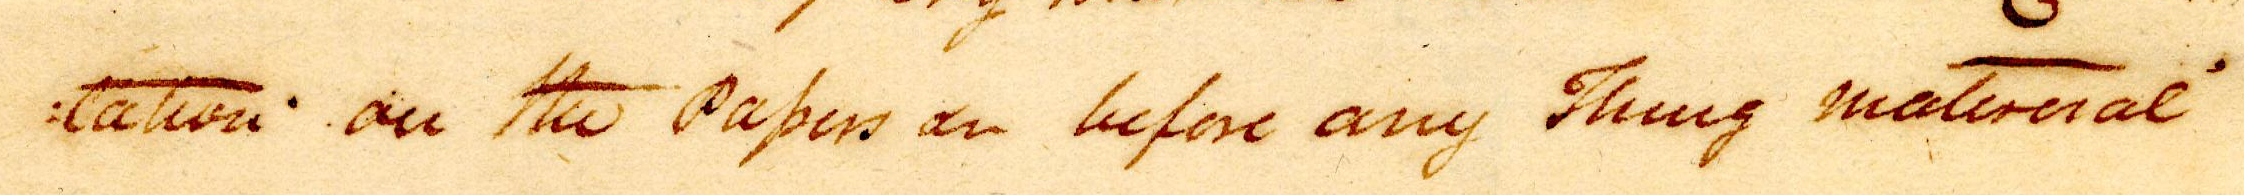-tation on the Papers on before any Thing material
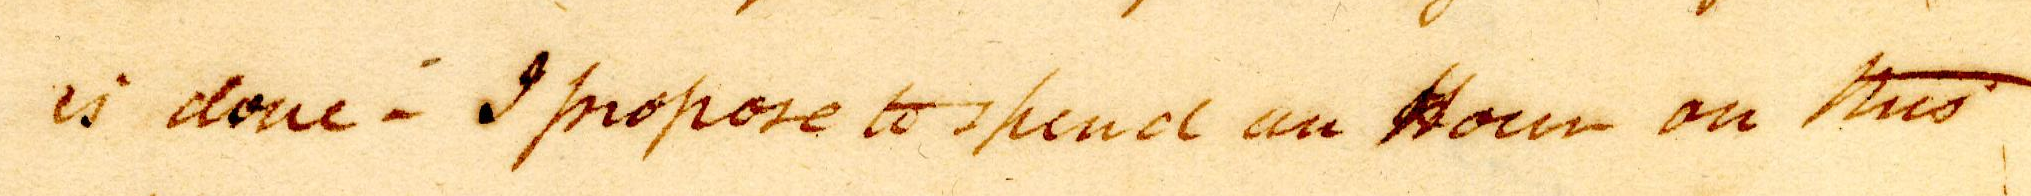is done. I propose to spend an Hour on this
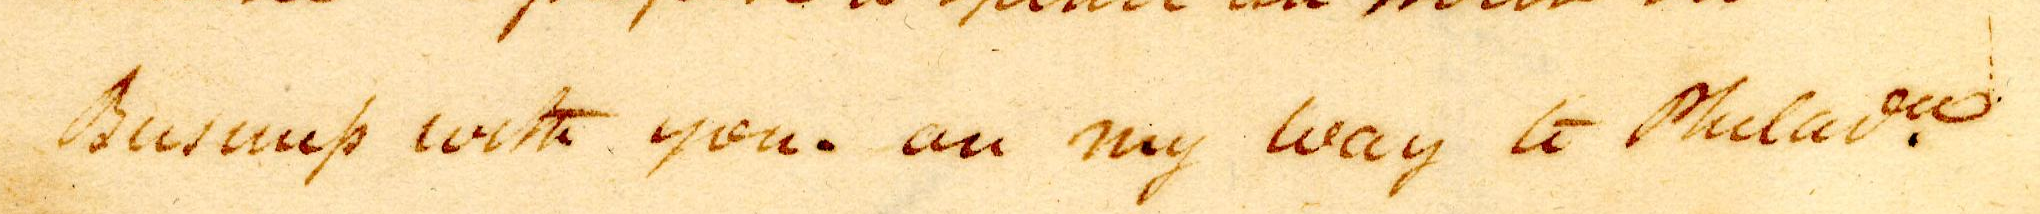Business with you. On my way to Philad^a.
